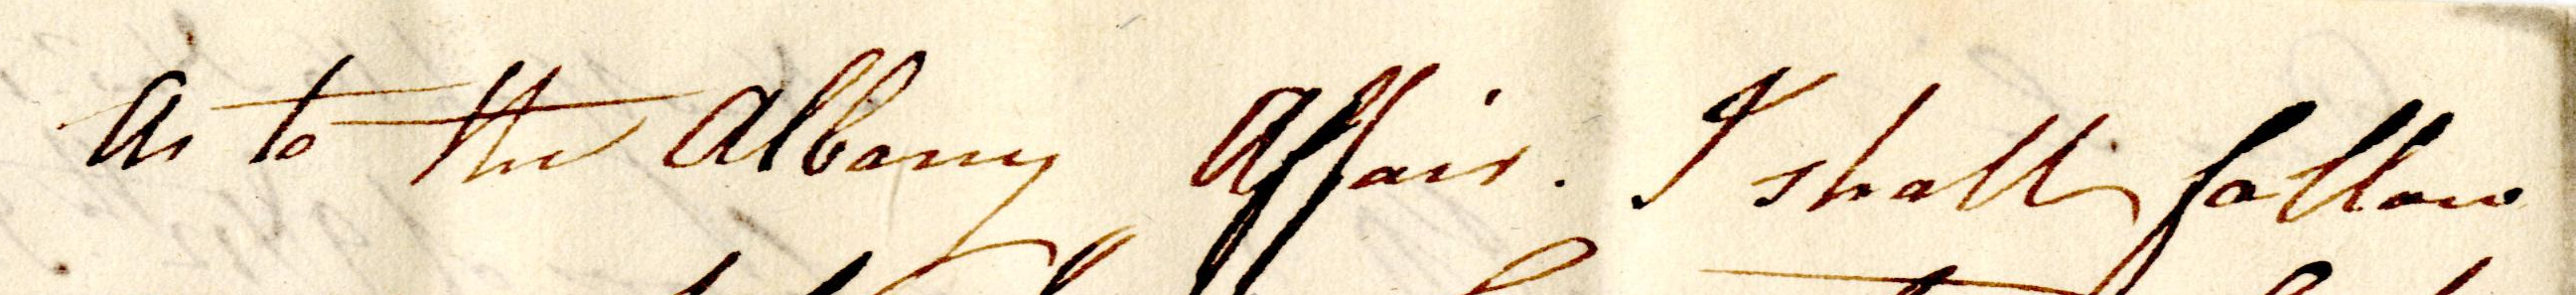As to the Albany Affair. I shall follow
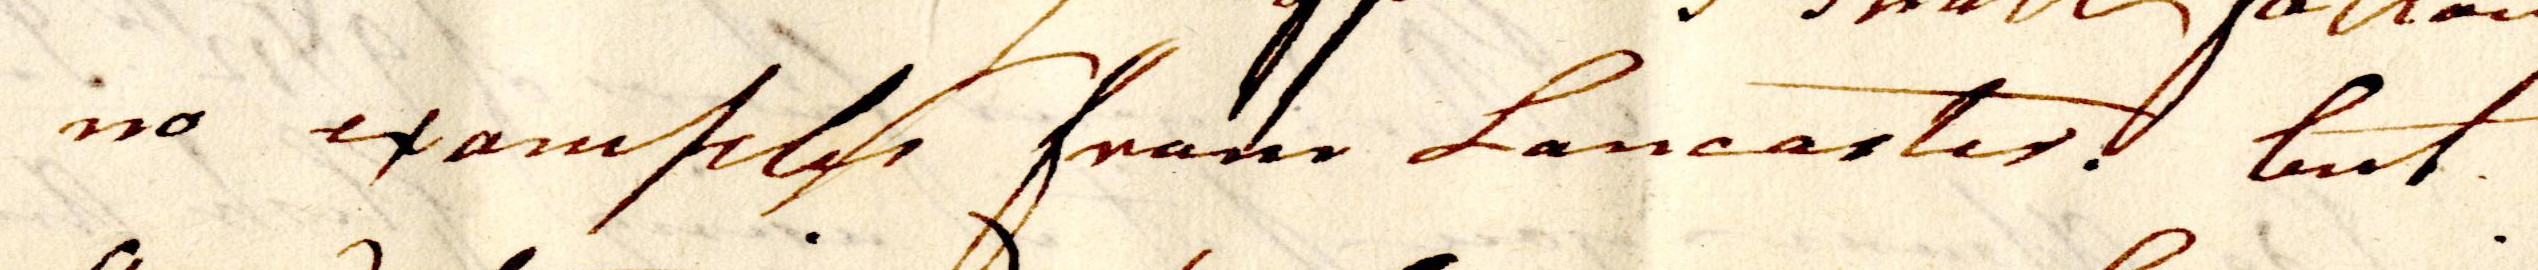no examples fromn Lancaster. But
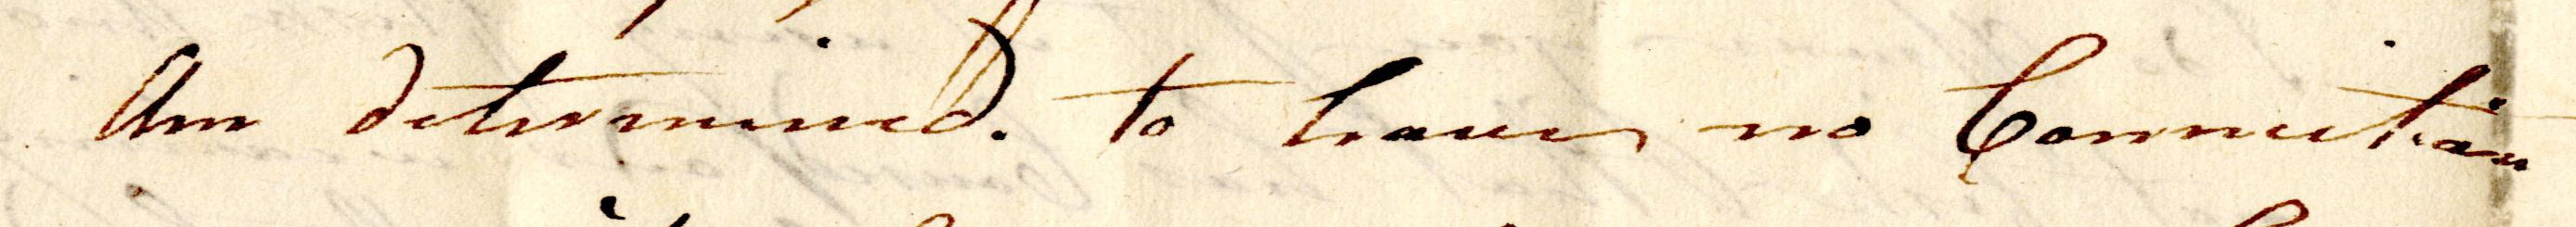An determined. to have no Connection
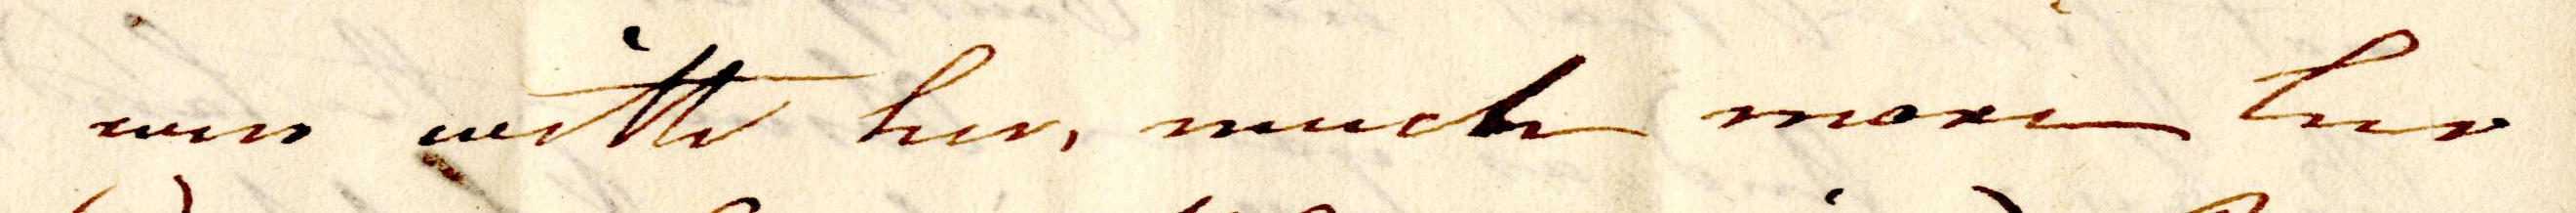ever with her, much more care
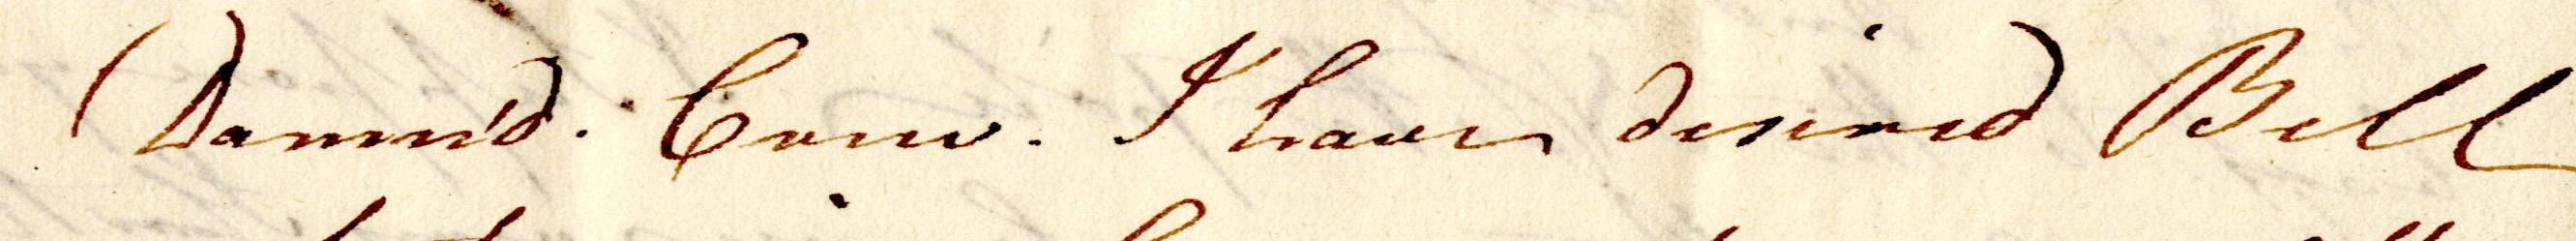Damm'd. Curse I have desired Bell
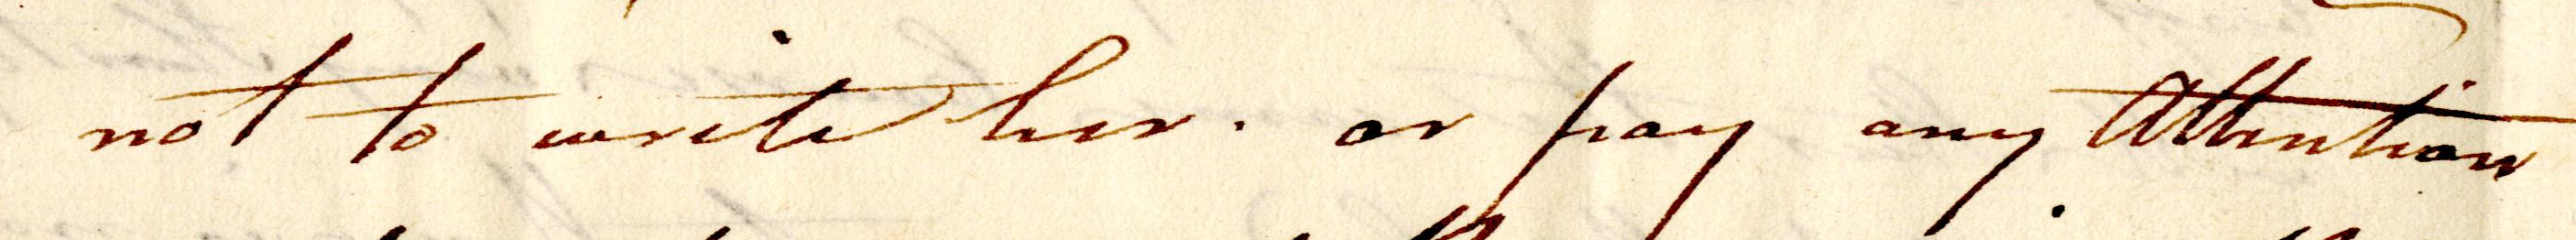not to write her: or pay any attention
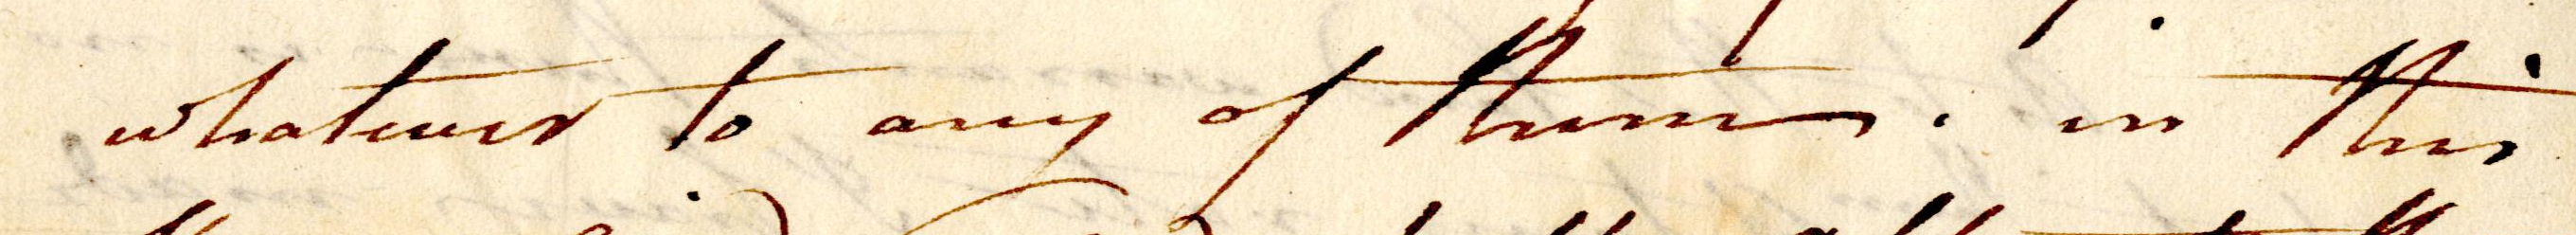whatever to any of them in this
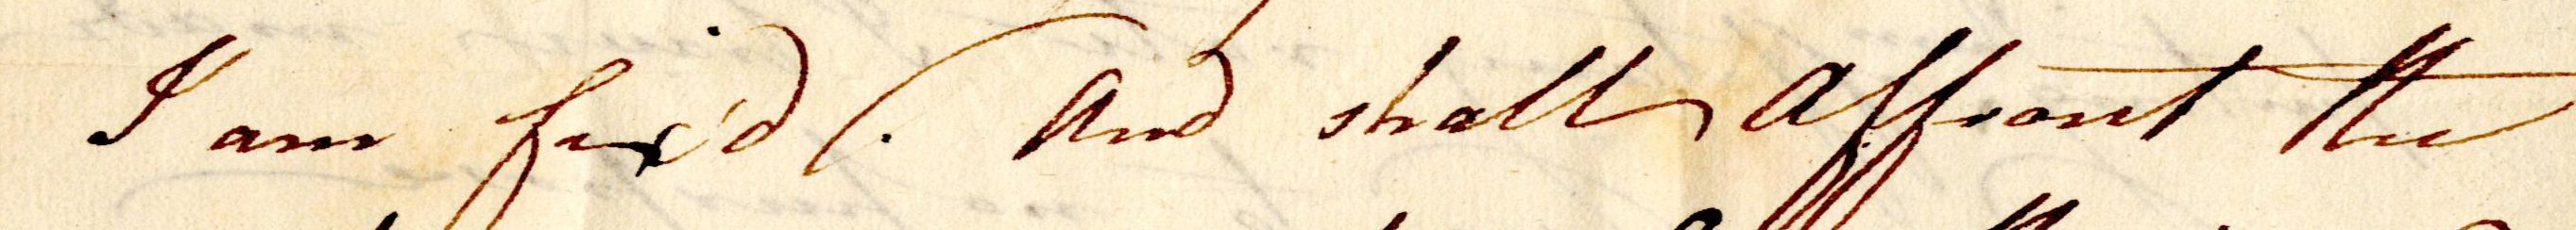I am fix'd. and shall affront the
